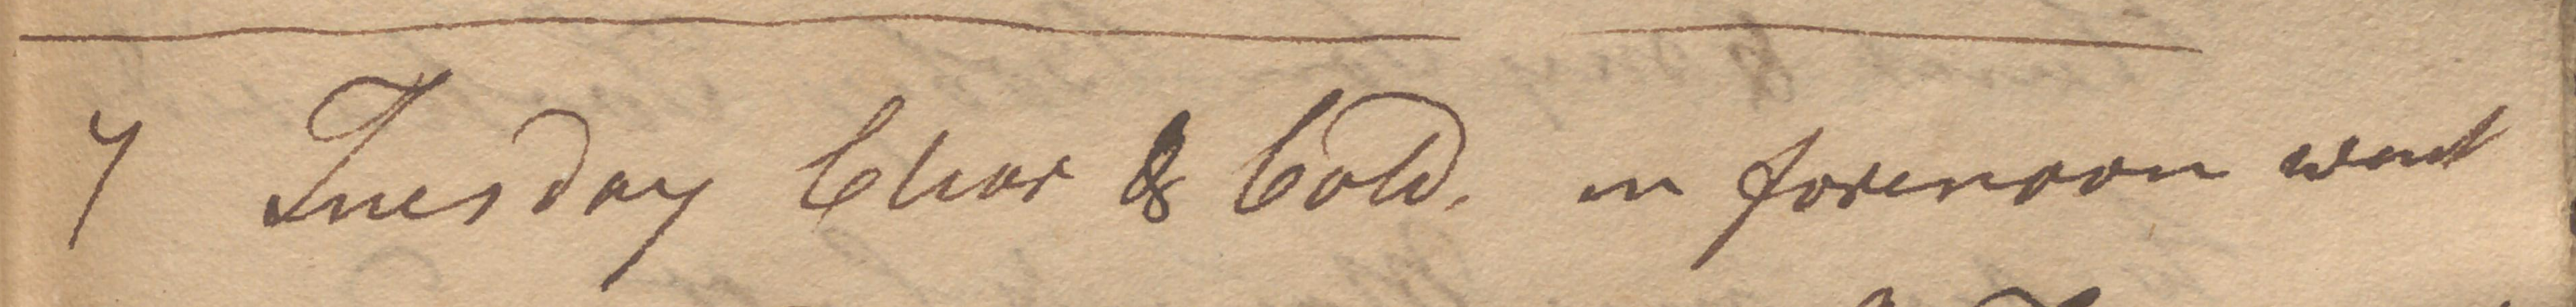7 Tuesday Clear & Cold. in forenoon went
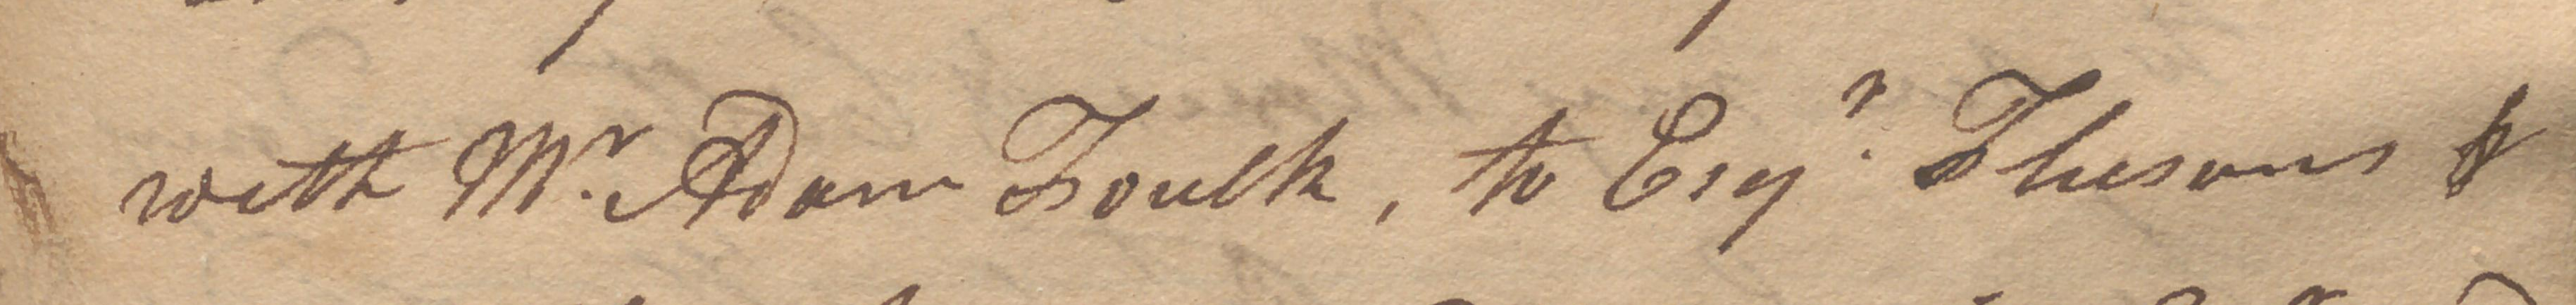with M^r. Adam Foulk, to Esq^r. Thesures &
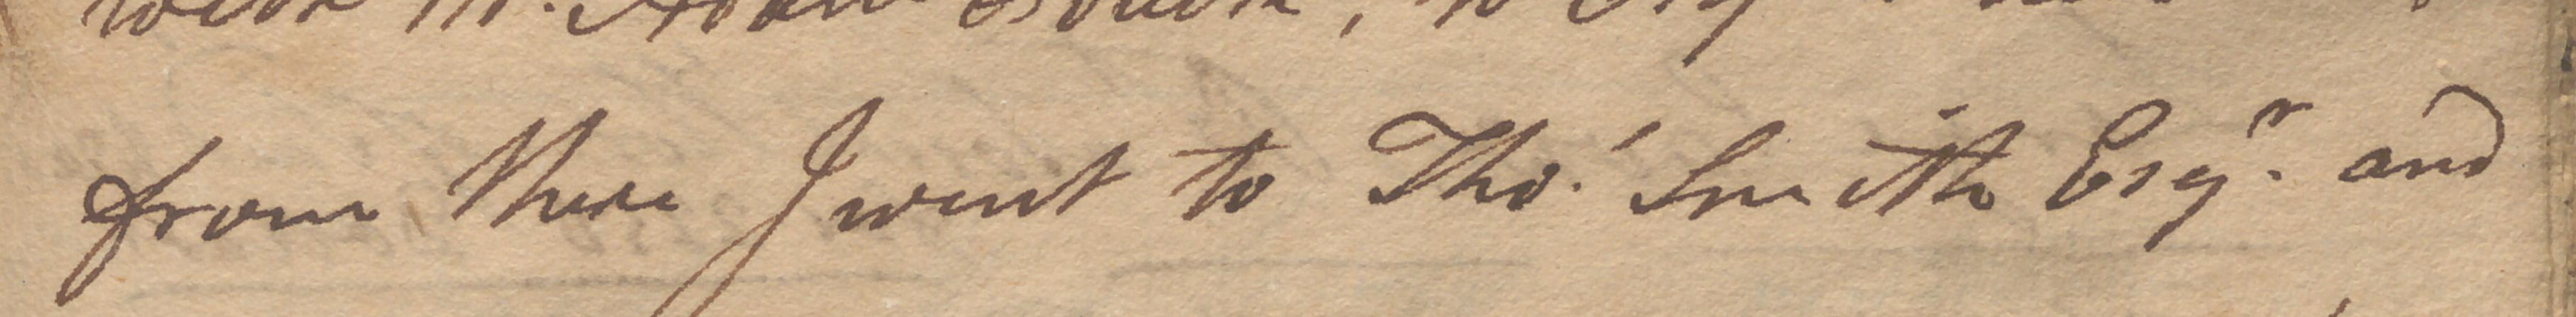from there I went to Tho^s. Smith Esq^r. and
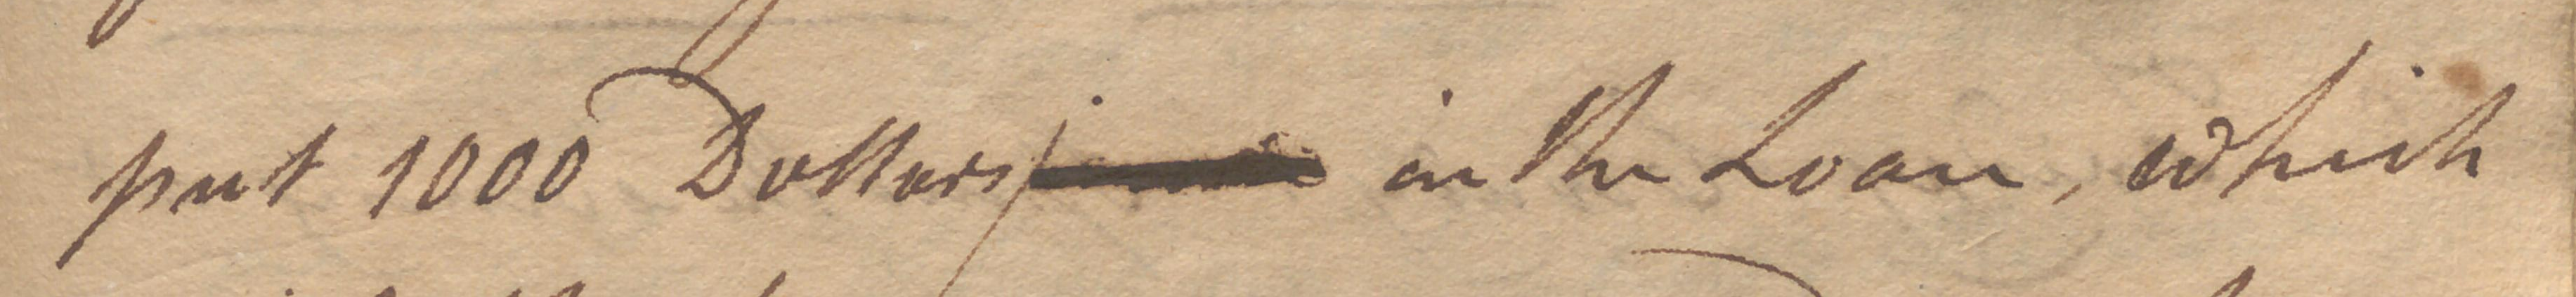put 1000 Dollars [_____] in the Loan, which
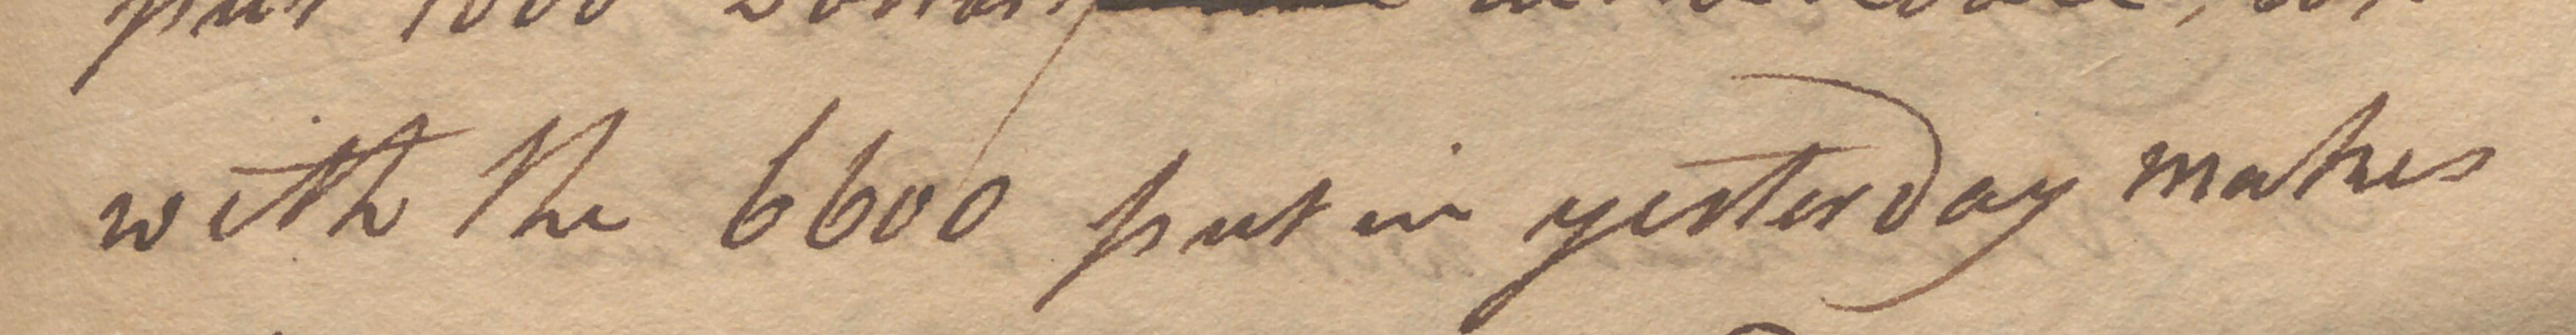with the 6000 put in yesterday makes
